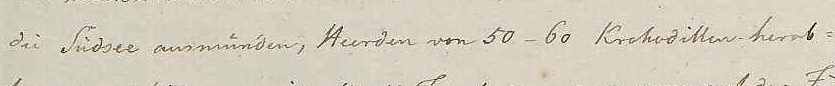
die Südsee ausmünden, Heerden von 50–60 Krokodillen herab-
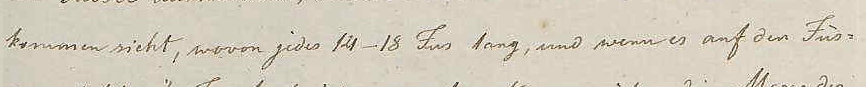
kommen sieht, wovon jedes 14–18 Fus lang, und wenn es auf den Füs-
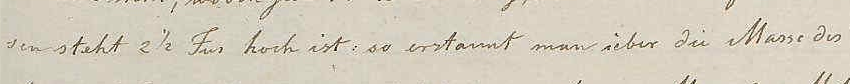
sen steht 2½ Fus hoch ist: so erstaunt man über die Masse des
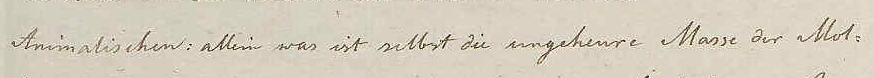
Animalischen: allein was ist selbst die ungeheure Masse der Mol-
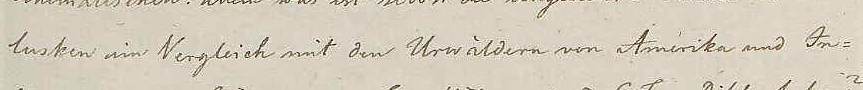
lusken im Vergleich mit den Urwäldern von Amerika und In-
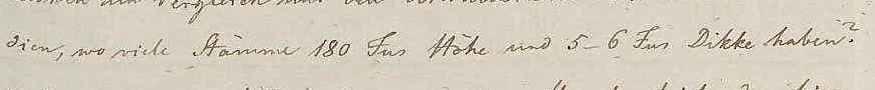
dien, wo viele Stämme 180 Fus Höhe und 5–6 Fus Dikke haben?
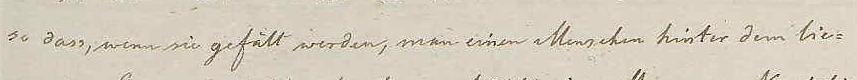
so dass, wenn sie gefält werden, man einen Menschen hinter dem lie-
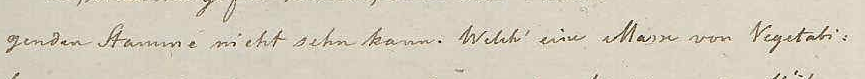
genden Stamme nicht sehn kann. Welch' eine Masse von Vegetabi-
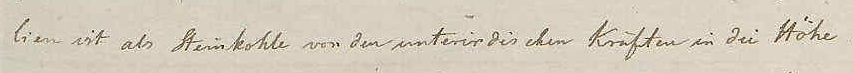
lien ist als Steinkohle von den unterirdischen Kräften in die Höhe
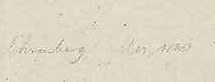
ThierePflanzen, das
